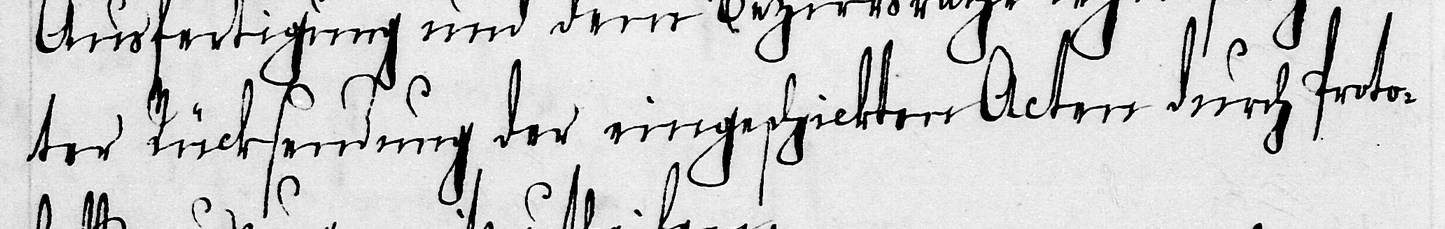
ter Rücksendung der eingeschickten Acten durch Proto¬
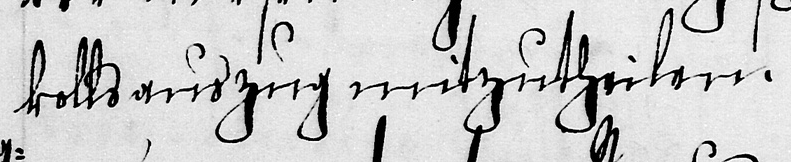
kollsauszug mitzutheilen.
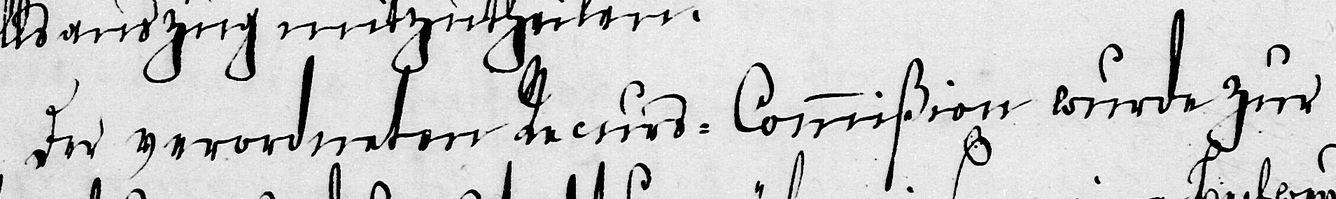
Der verordneten Recurs-Commißion wurde zur
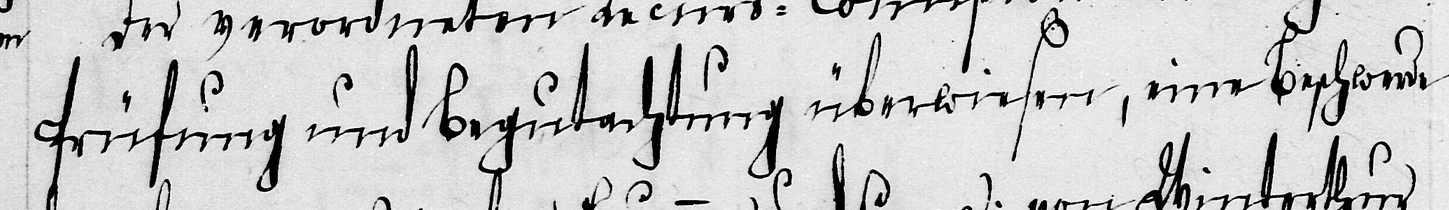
Prüfung und Begutachtung überwiesen, eine Beschwer¬
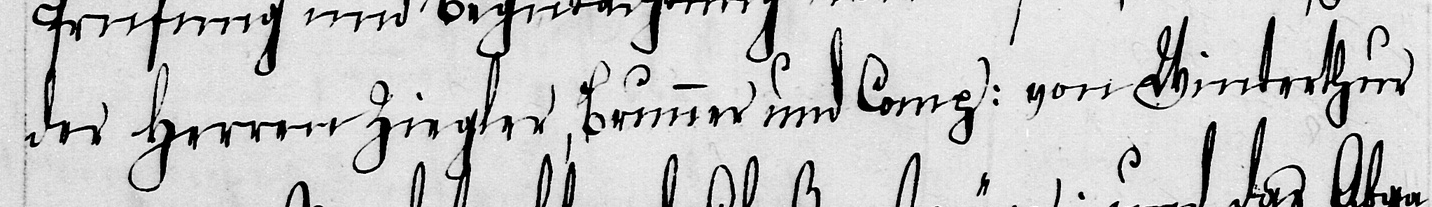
der Herren Ziegler, Brunner und Comp: von Winterthur
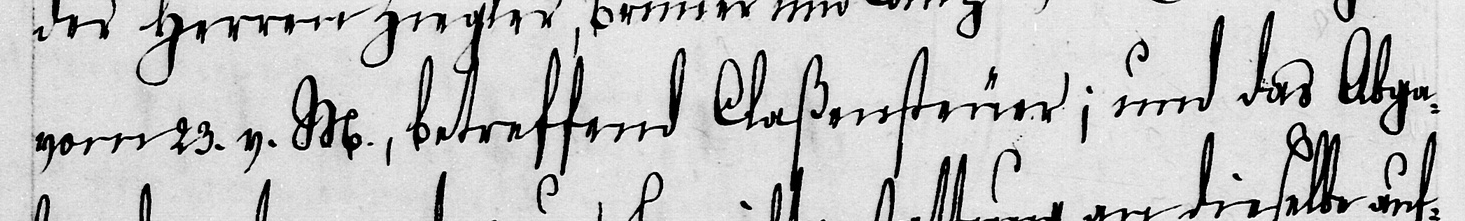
vom 23. v. M., betreffend Claßensteuer; und das Abga¬
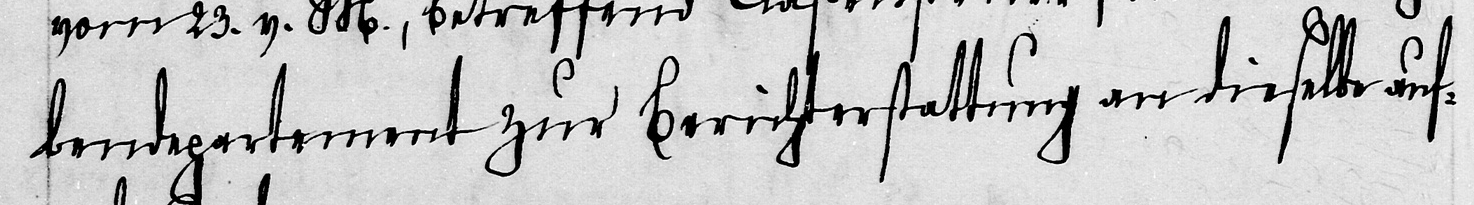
bendepartement zur Berichterstattung an dieselbe auf¬
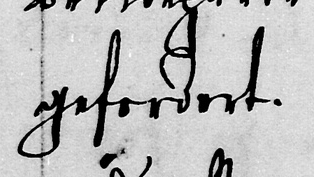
gefordert.
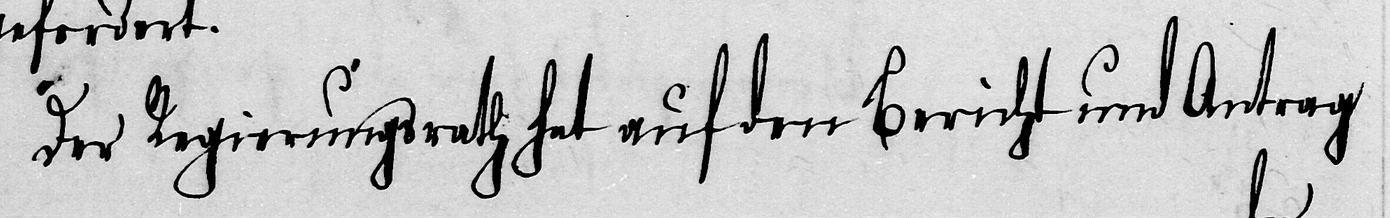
Der Regierungsrath hat auf den Bericht und Antrag
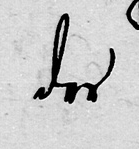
de
